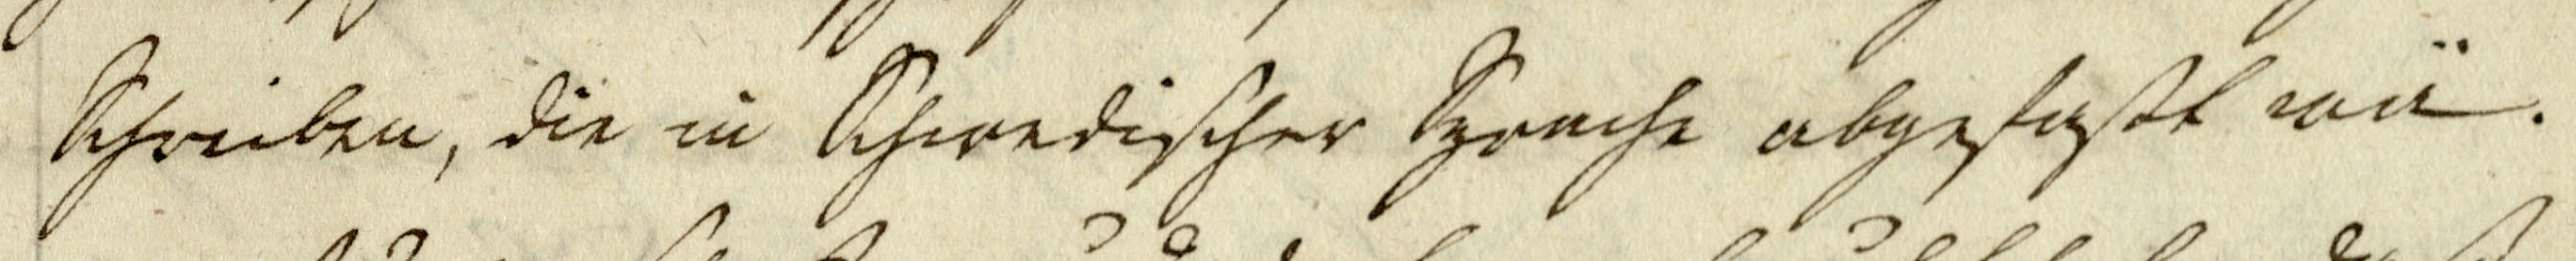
Schreiben, die in Schwedischer Sprache abgefast wä¬
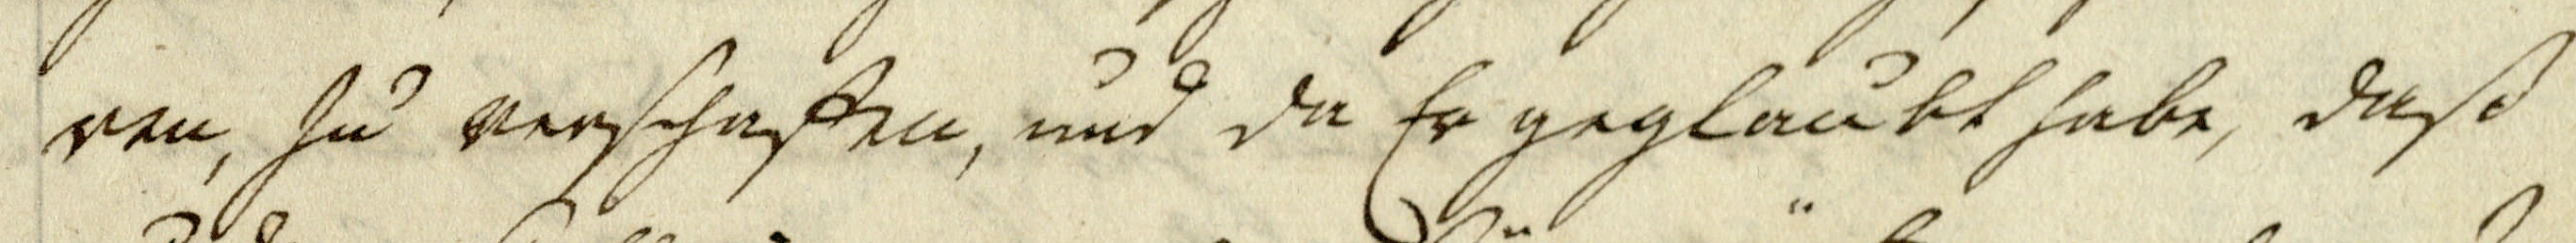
ren, zu verschaffen, und da Er geglaubt habe, daß
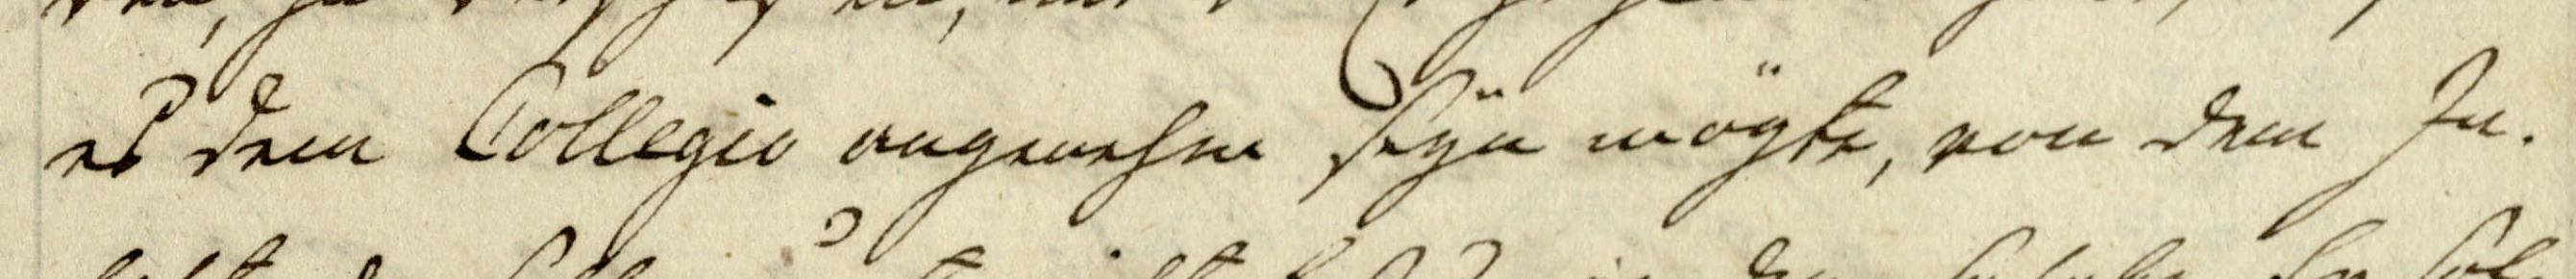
es dem Collegio angenehm seÿn mögte, von dem In¬
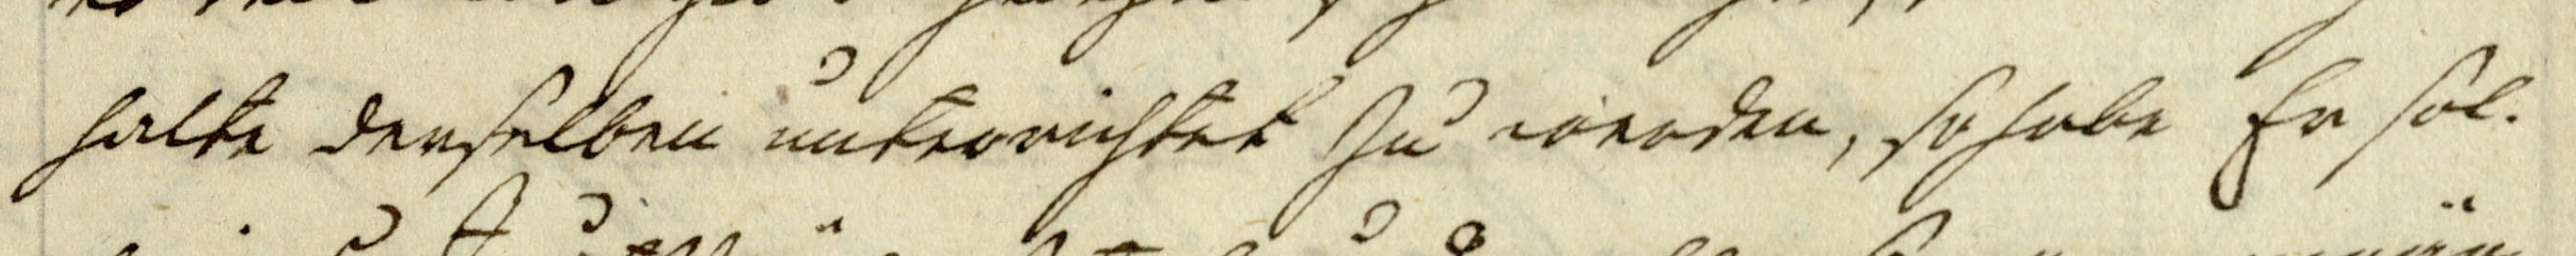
halte derselben unterrichtet zu werden, so habe Er sol¬
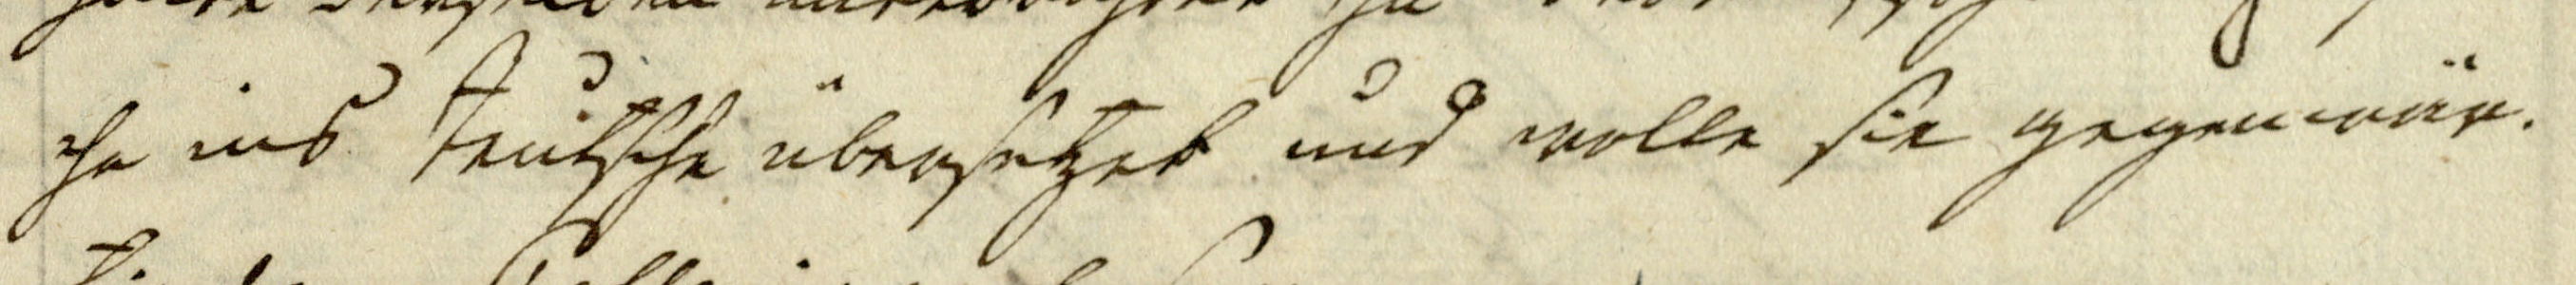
che ins Teutsche übersetzet und wolle sie gegenwär¬
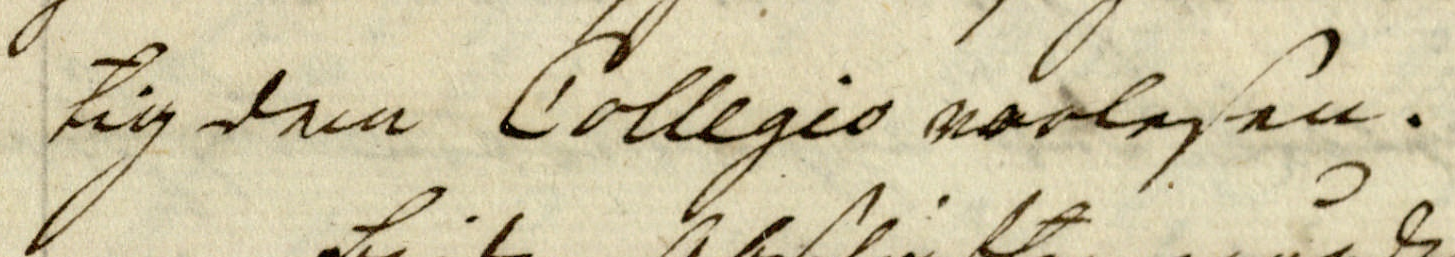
tig dem Collegio vorlesen.
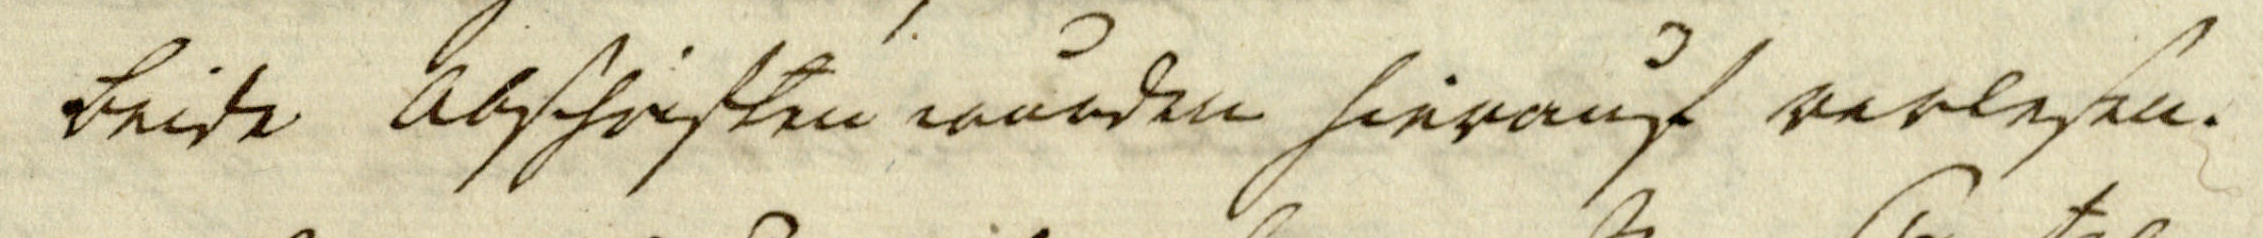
Beide Abschriften wurden hierauf verlesen.
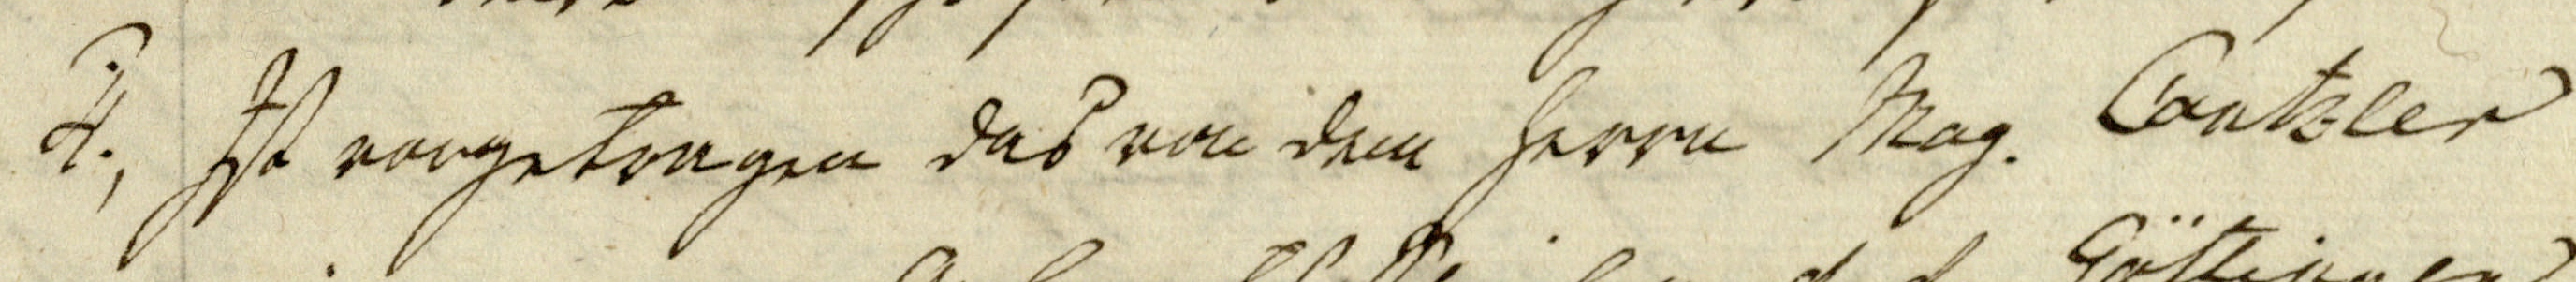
4., Ist vorgetragen das von dem Herrn Mag. Cantzler
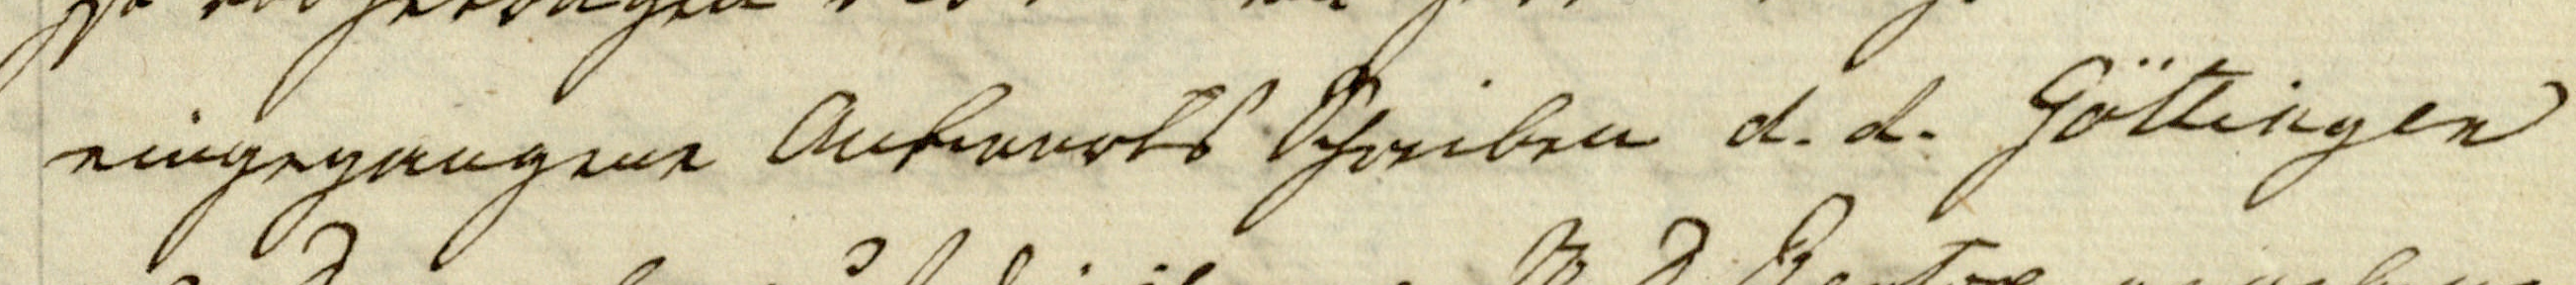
eingegangene Antworts Schreiben d. d. Göttingen
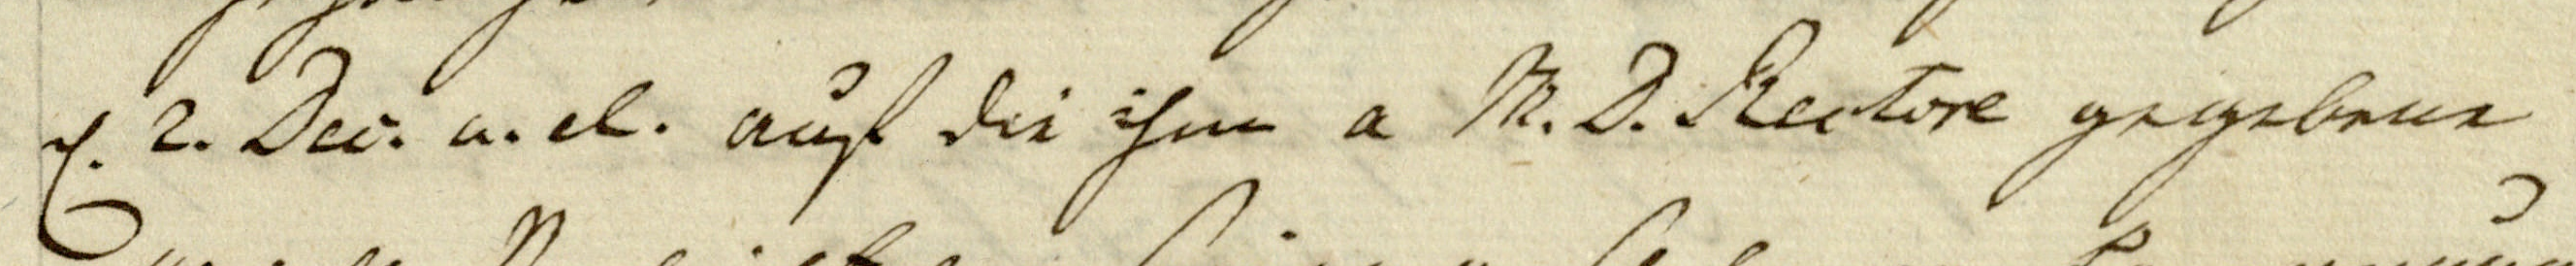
d. 2. Dec. a. d. auf die ihm a. M. D. Rectore gegebene
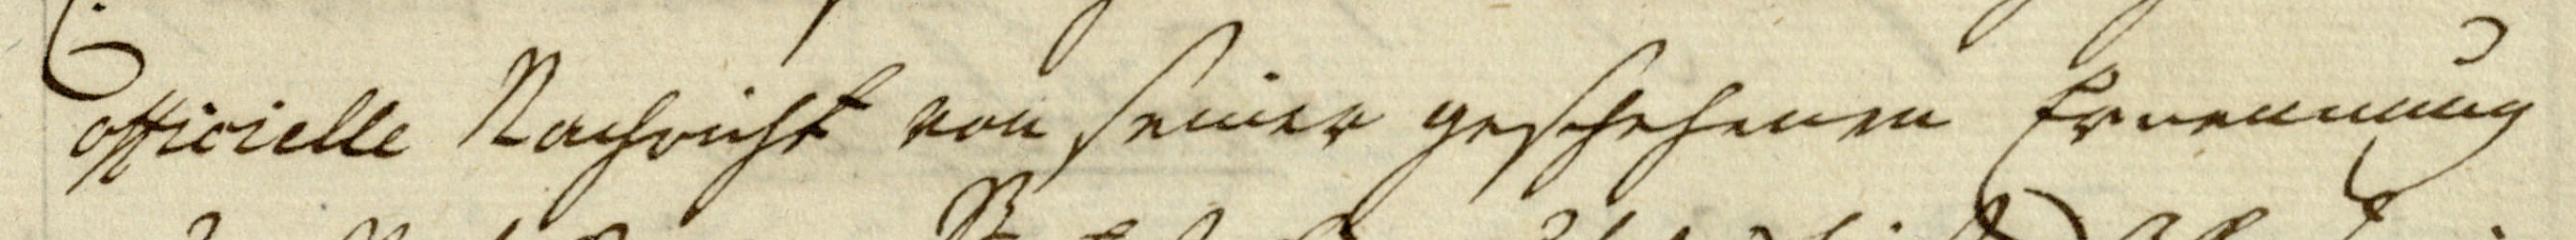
officielle Nachricht von seiner geschehenen Ernennung
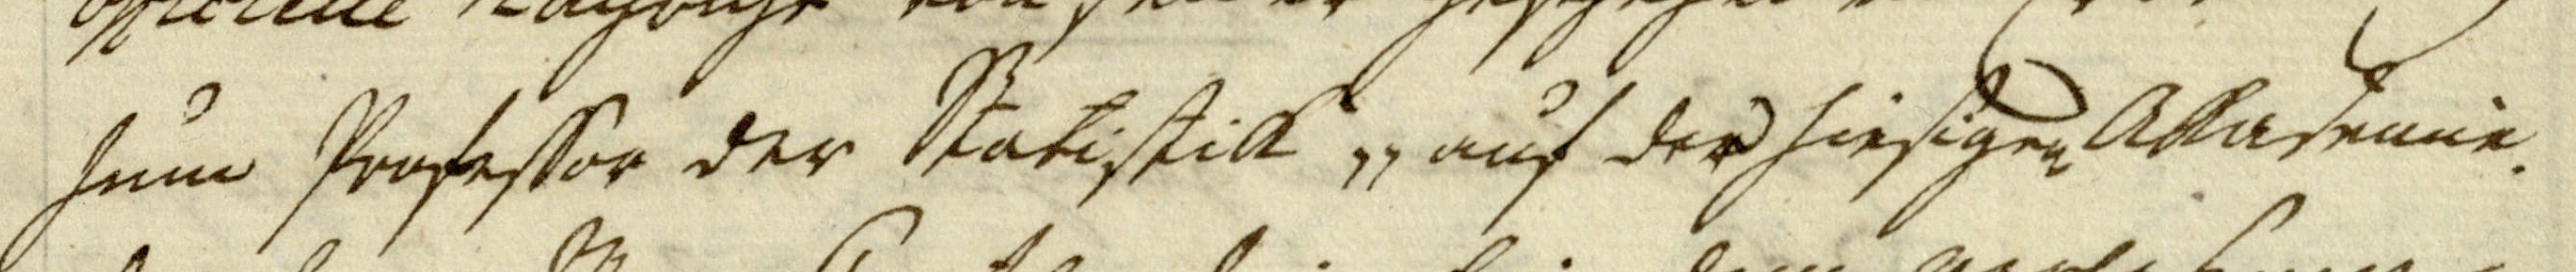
zum Professor der Statistik auf der hiesigen Akademie.
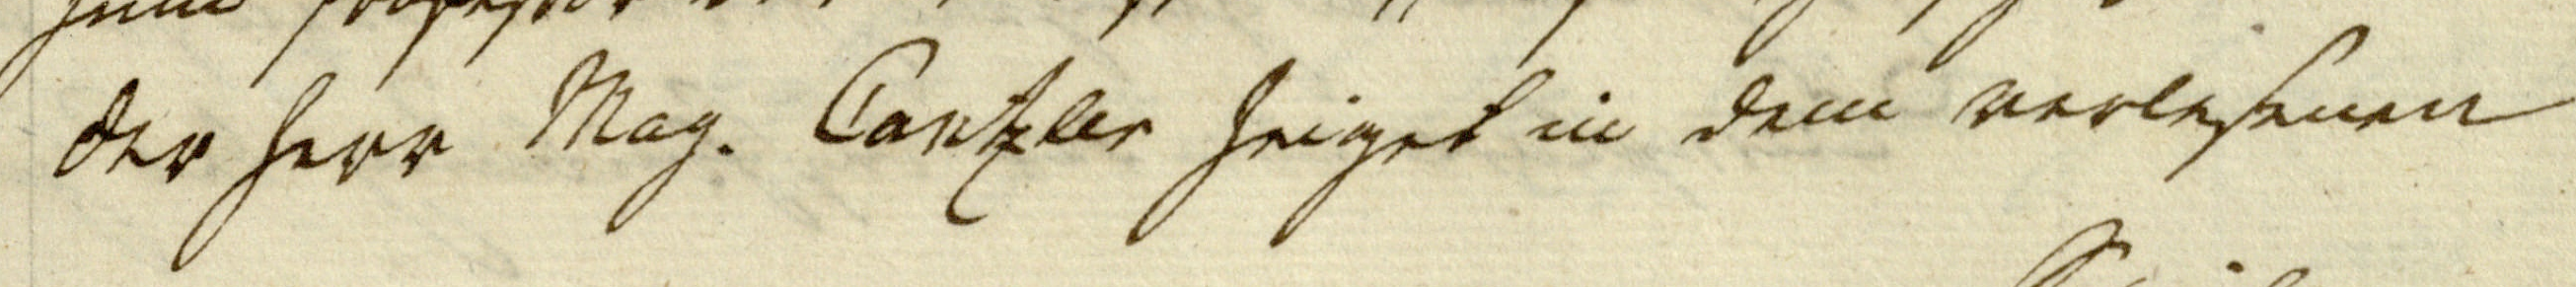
Der Herr Mag. Cantzler zeiget in dem verlesenen
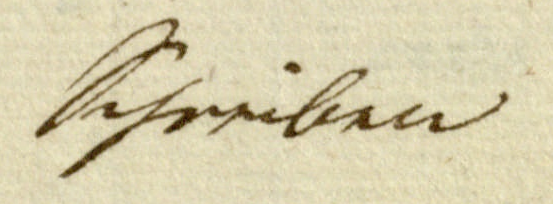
Schreiben
